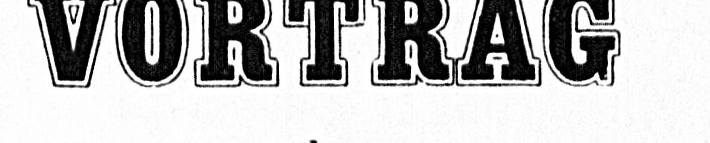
VORTRAG
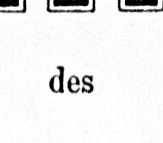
des
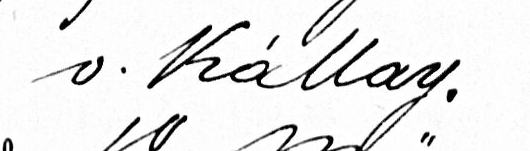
v. Kállay.
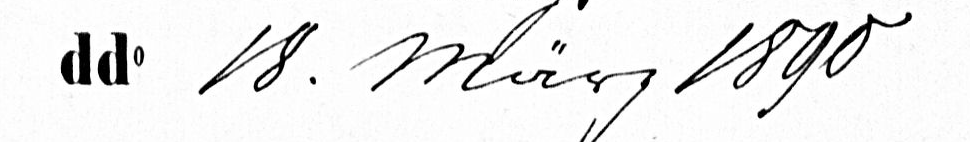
dd° 18. März 1890
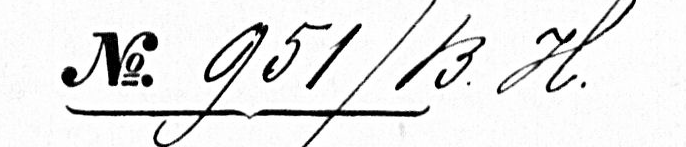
N° 951/B.H.
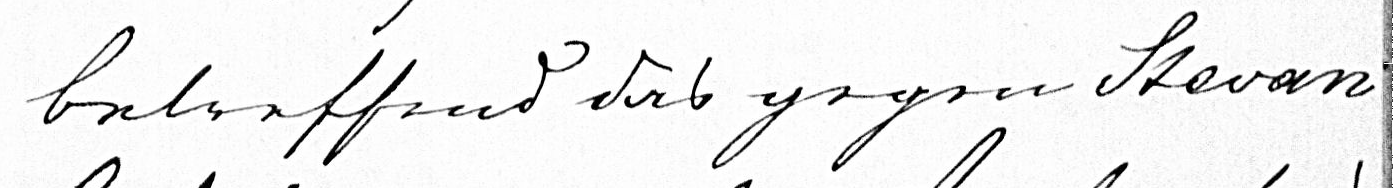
betreffend das gegen Stevan
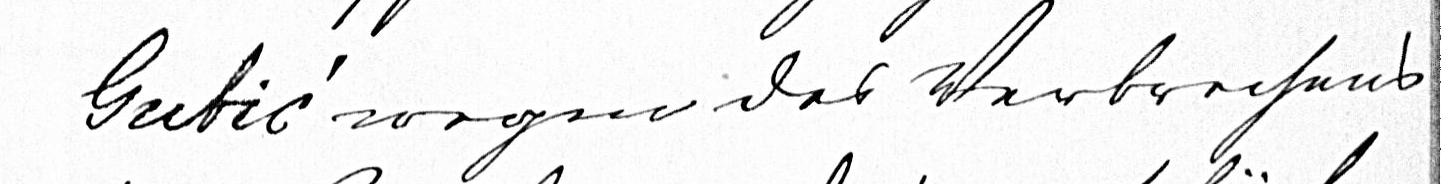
Gubić wegen des Verbrechens
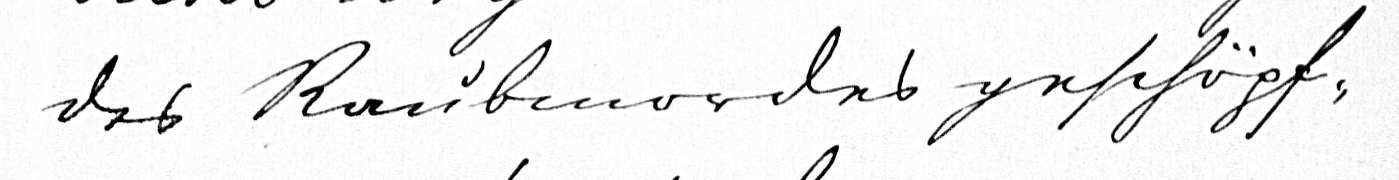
des Raubmordes geschöpf¬
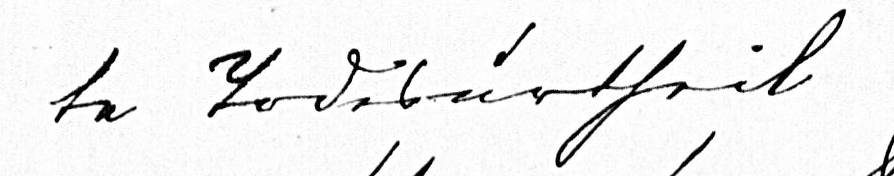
te Todesurtheil
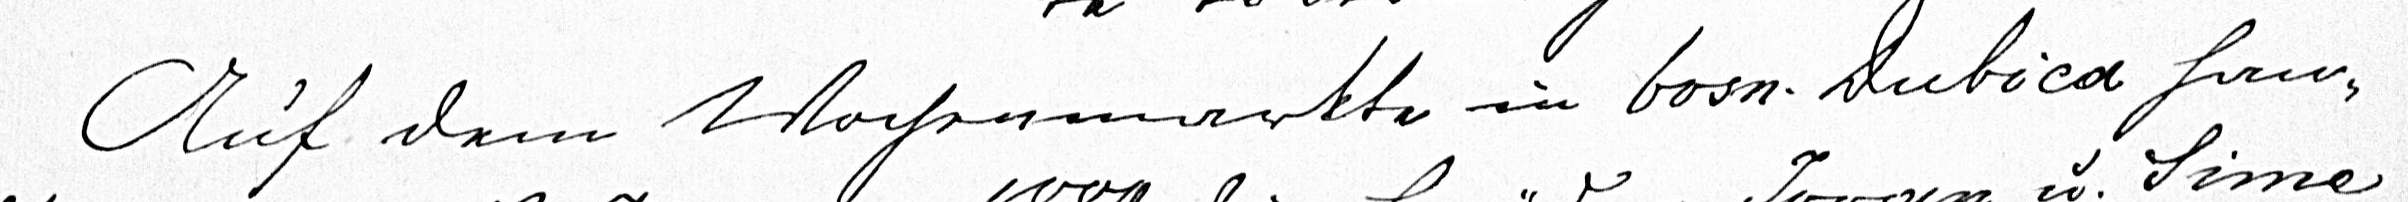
Auf dem Wochenmarkte in bosn. Dubica han¬
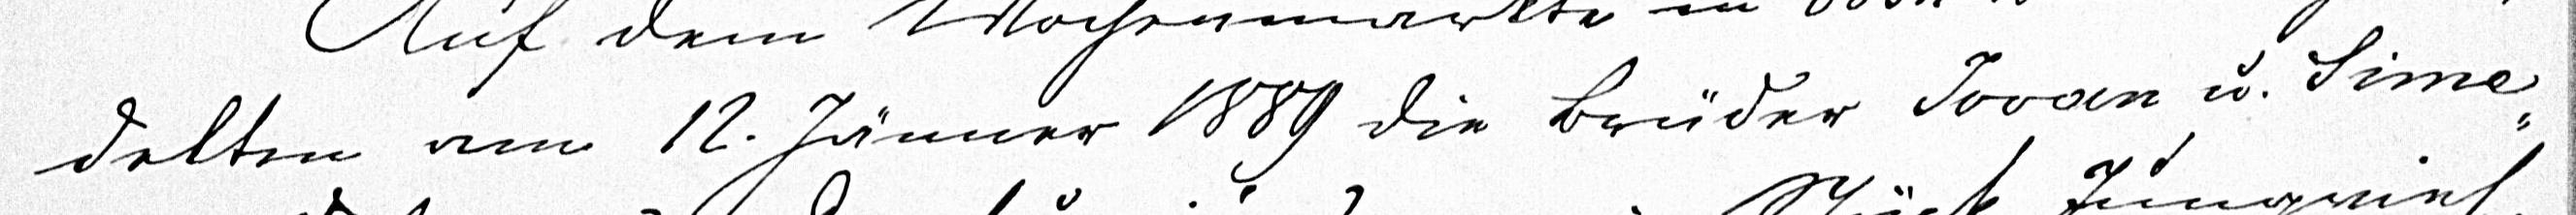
delten am 12. Jänner 1889 die Brüder Jovan u. Sime¬
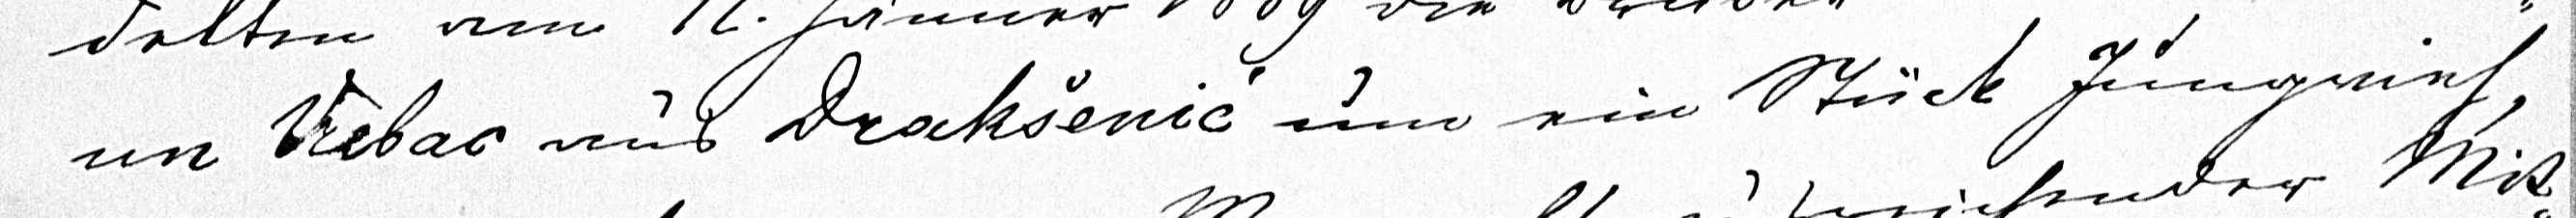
un Vrebac aus Drakšenić um ein Stück Jungvieh,
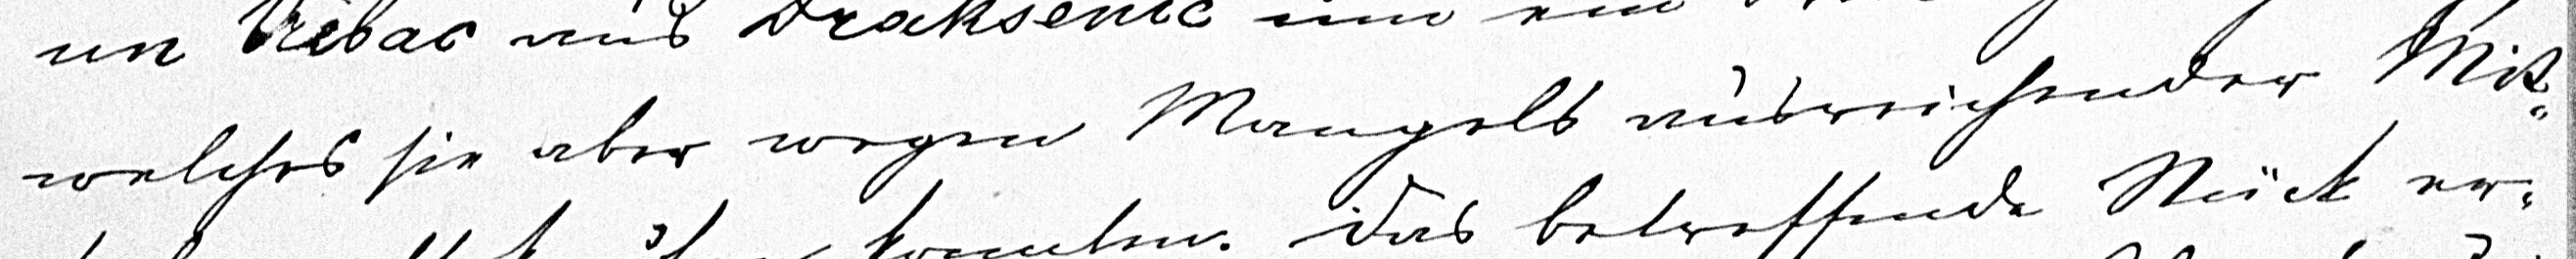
welches sie aber wegen Mangels ausreichender Mit¬
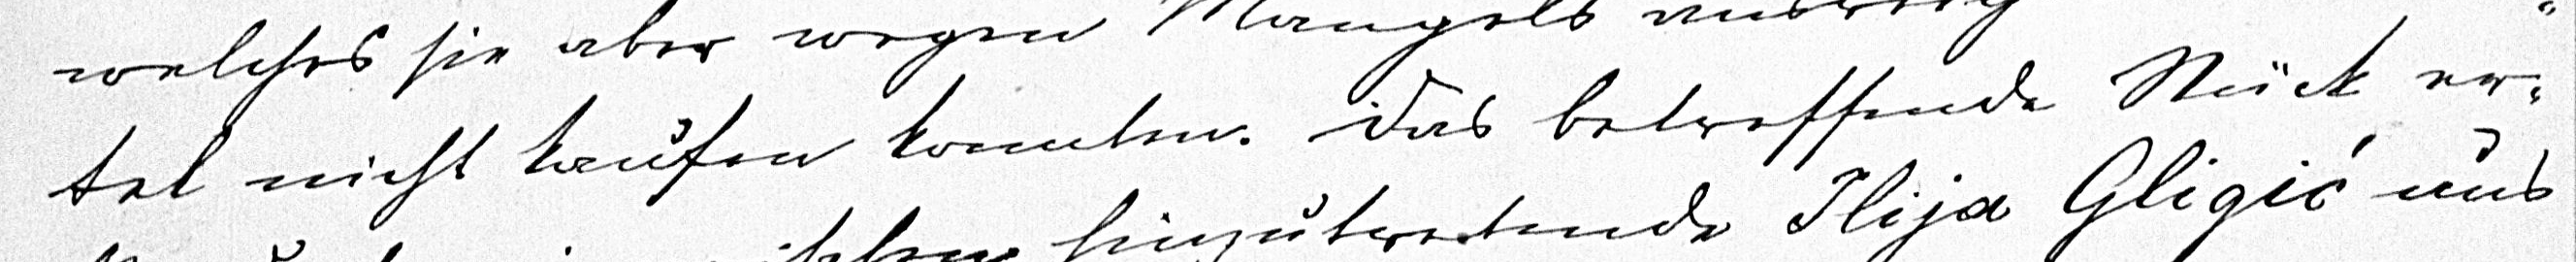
tel nicht kaufen konnten. Das betreffende Stück er¬
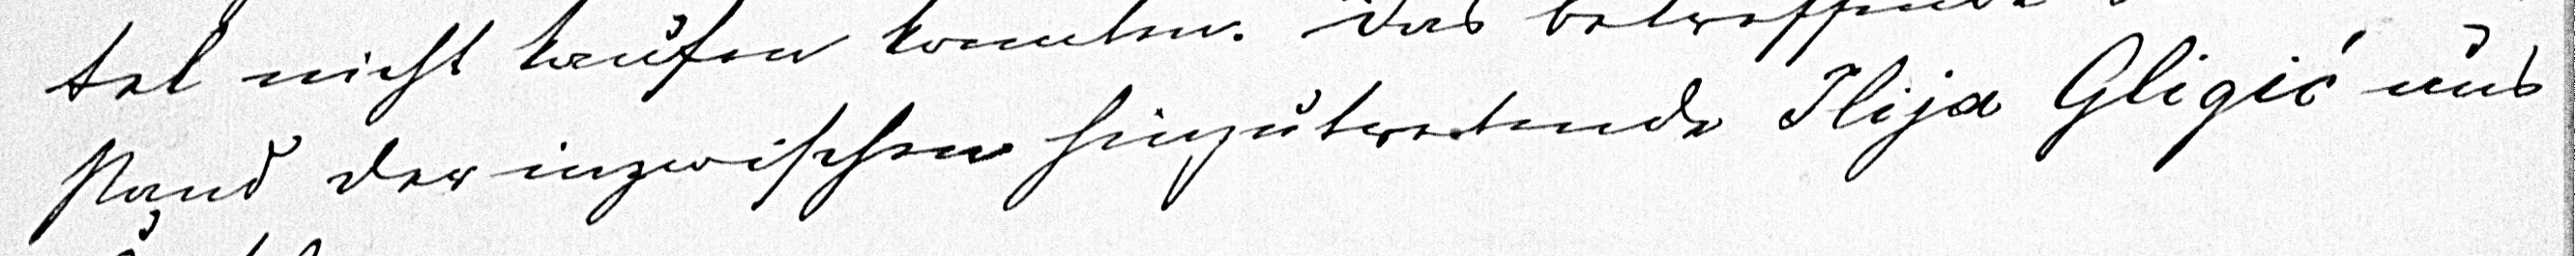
stand der inzwischen hinzutretende Ilija Gligić aus
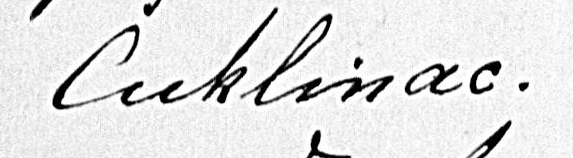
Cuklinac.
